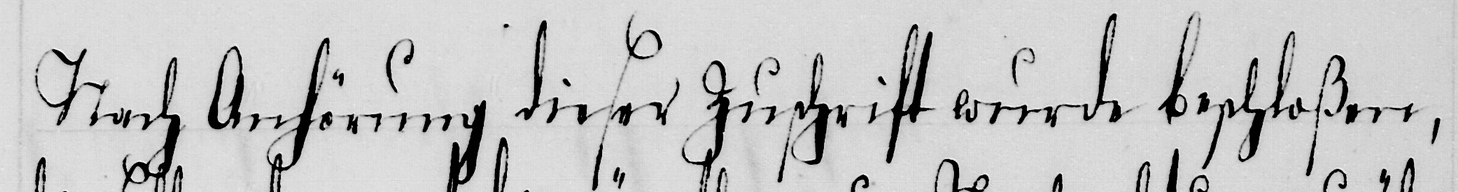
Nach Anhörung dieser Zuschrift wurde beschloßen,
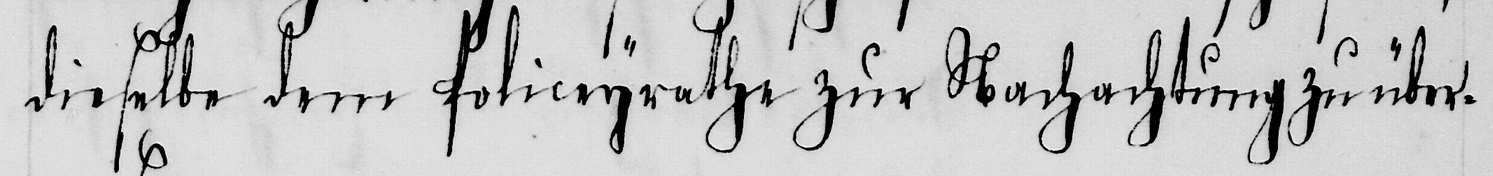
dieselbe dem Policeyrathe zur Nachachtung zu über¬
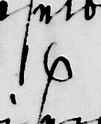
70.
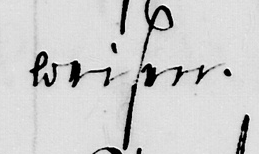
weisen.
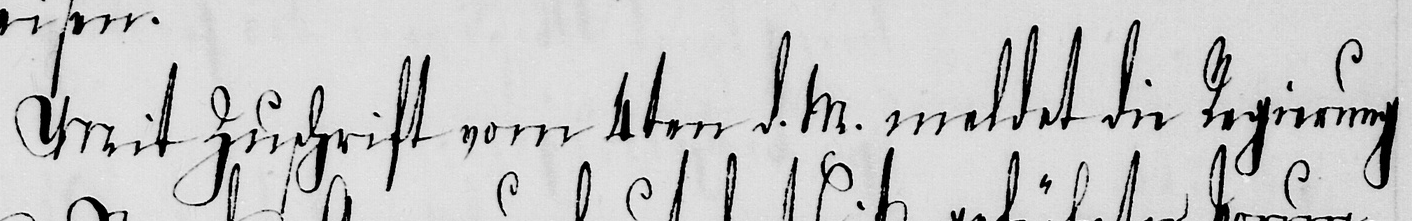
Mit Zuschrift vom 4ten d. M. meldet die Regierung
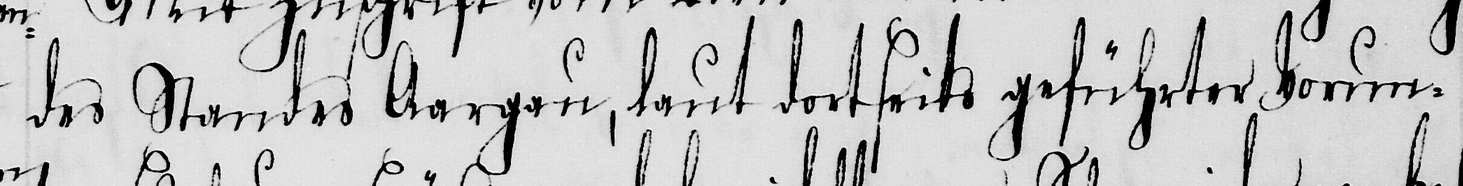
des Standes Aargau, laut dortseits geführter Vorun¬
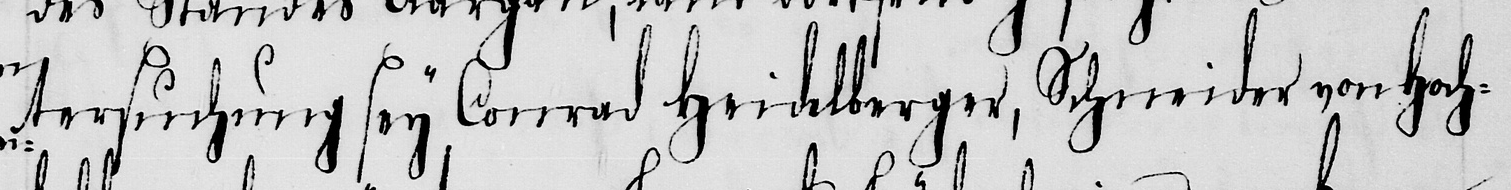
tersuchung bey Conrad Heidelberger, Schneider von Hoch¬
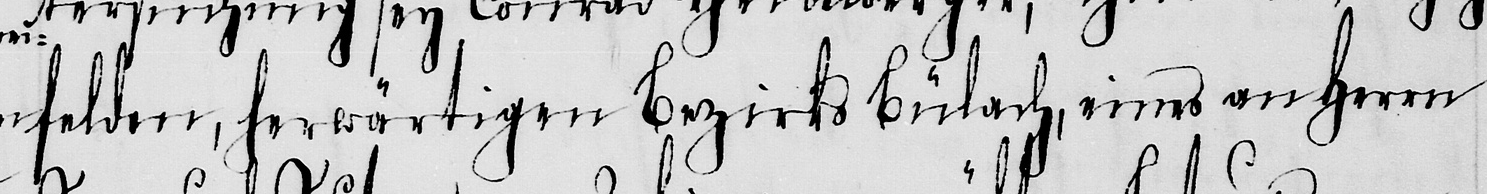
felden, herwärtigen Bezirks Bülach, eines an Herrn
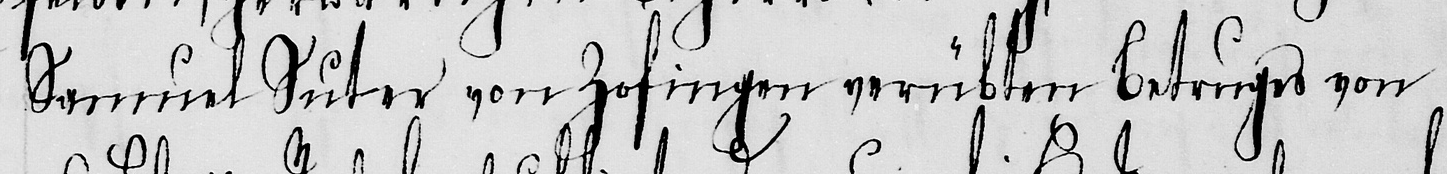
Samuel Suter von Zofingen verübten Betruges von
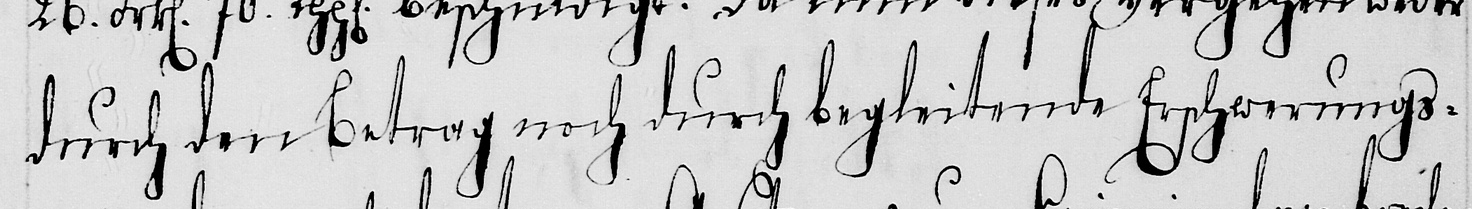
durch den Betrag noch durch begleitende Erschwerungs¬
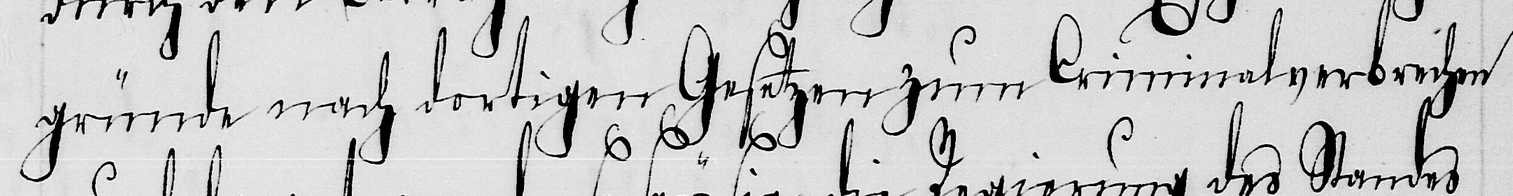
gründe nach dortigen Gesetzen zum Criminalverbrechen
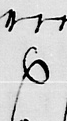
26.
